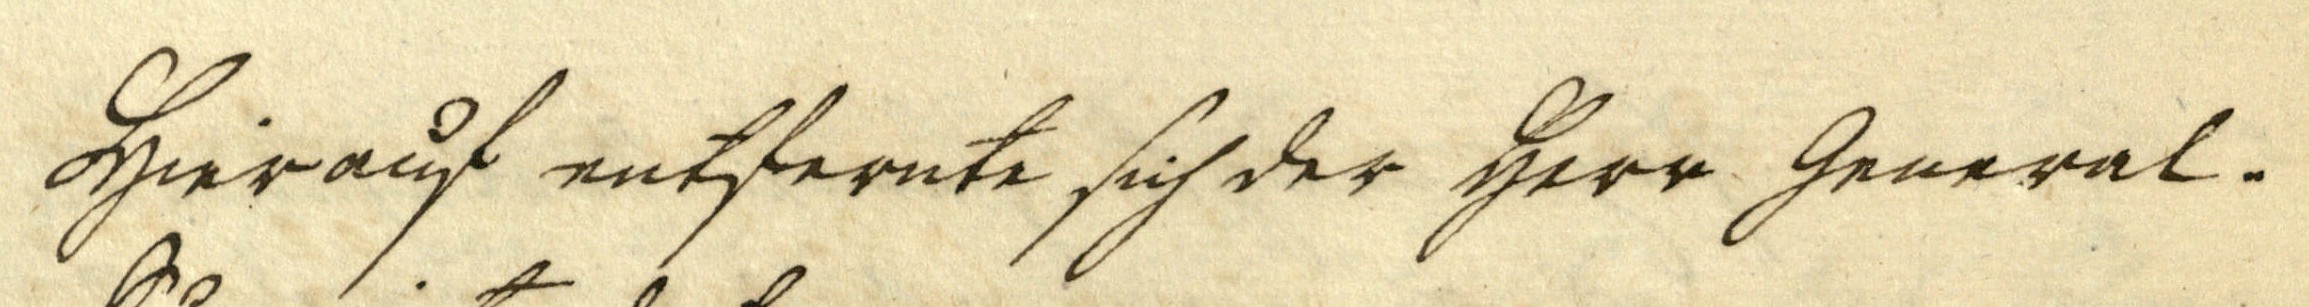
Hierauf entfern¬te sich der Herr General
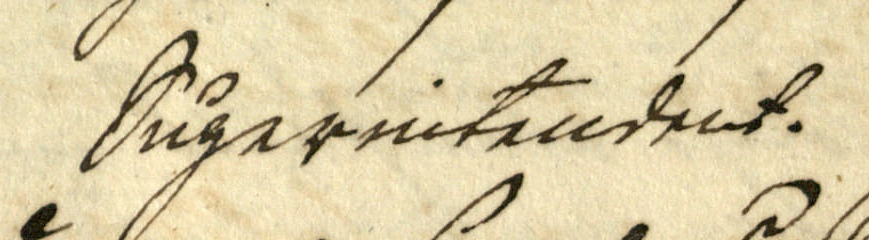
Superintendent.
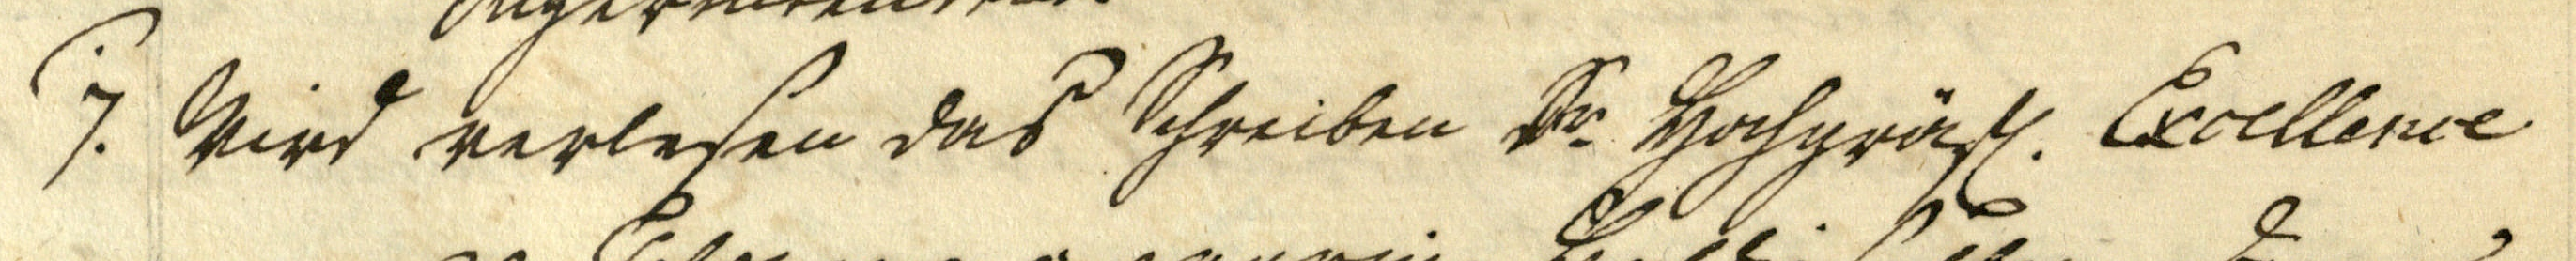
7. Wird verlesen das Schreiben Sr Hochgräfl. Excellence
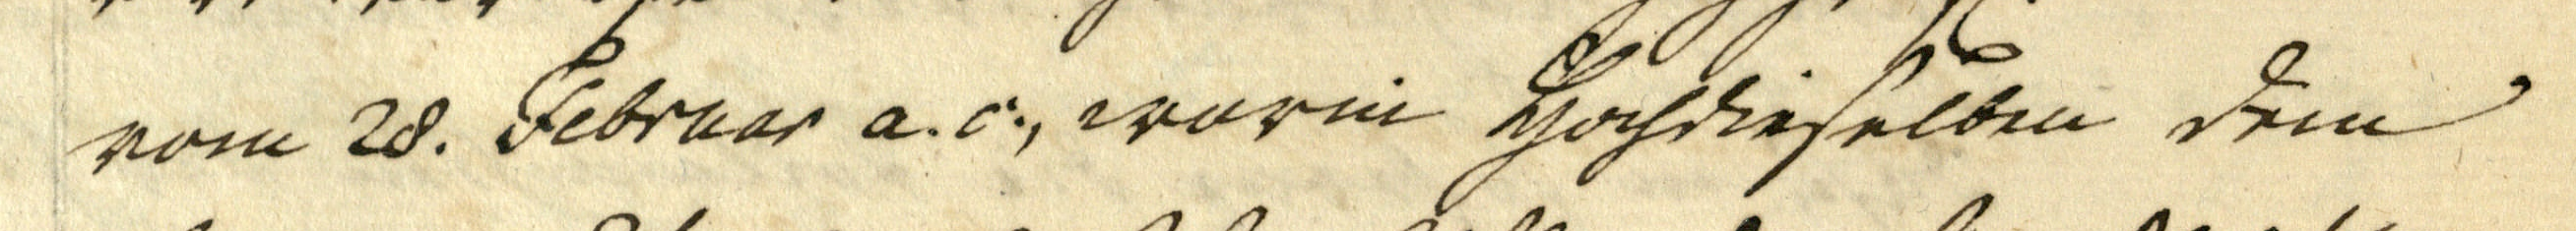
vom 28. Februar a. c., worin Hochdieselben dem
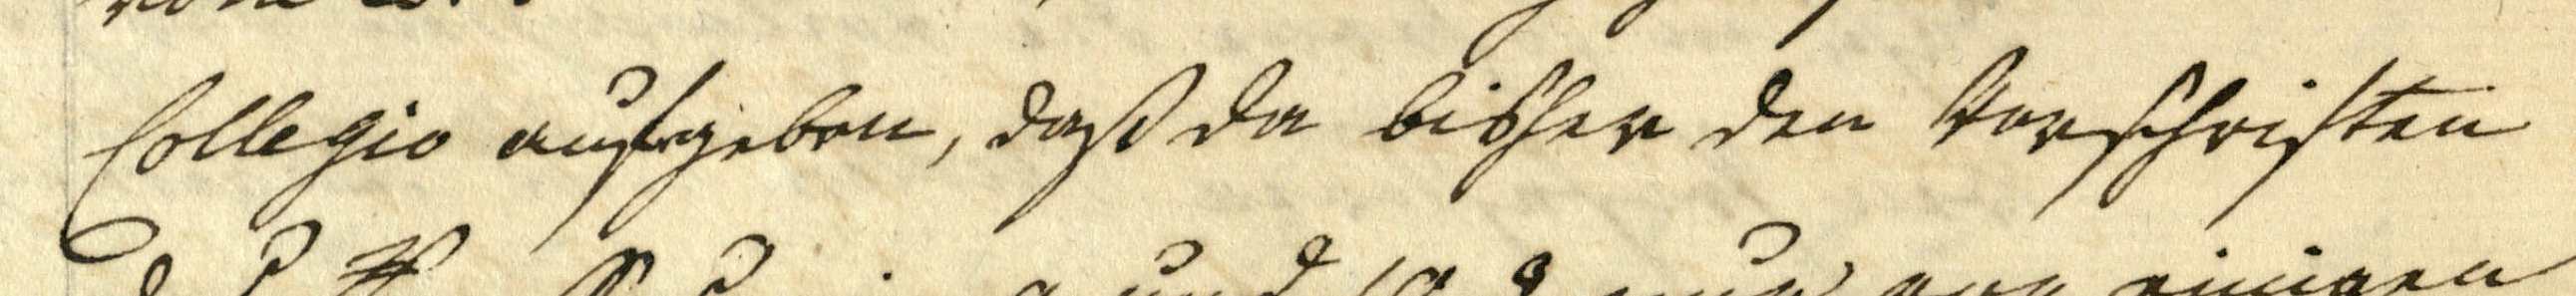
Collegio aufgeben, daß da bisher den Vorschriften
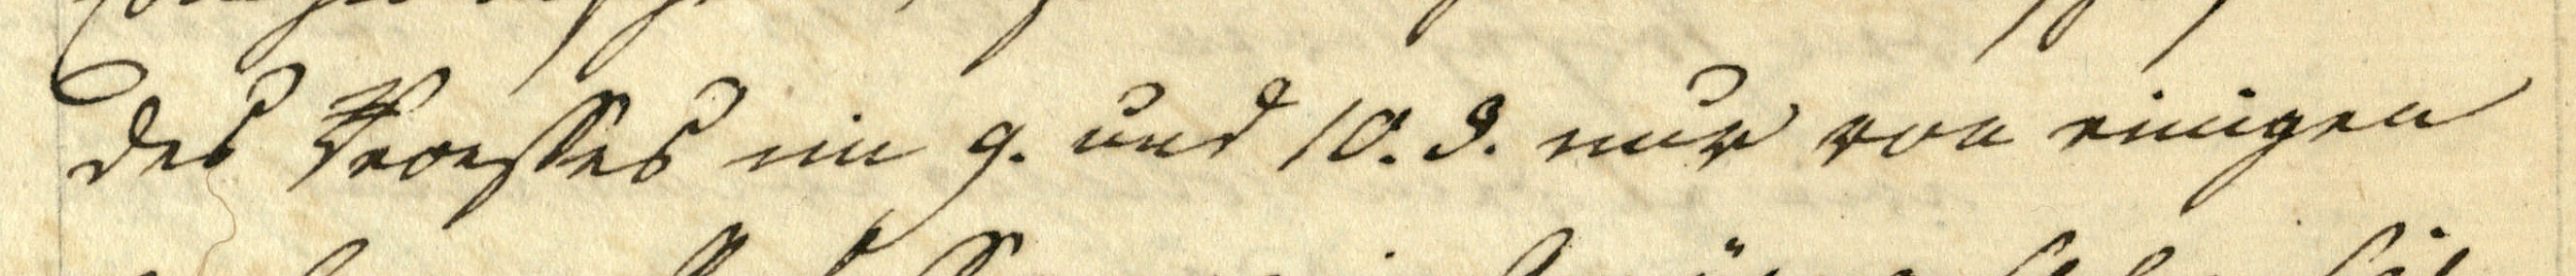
des Recesses in 9. und 10. §. nur von einigen
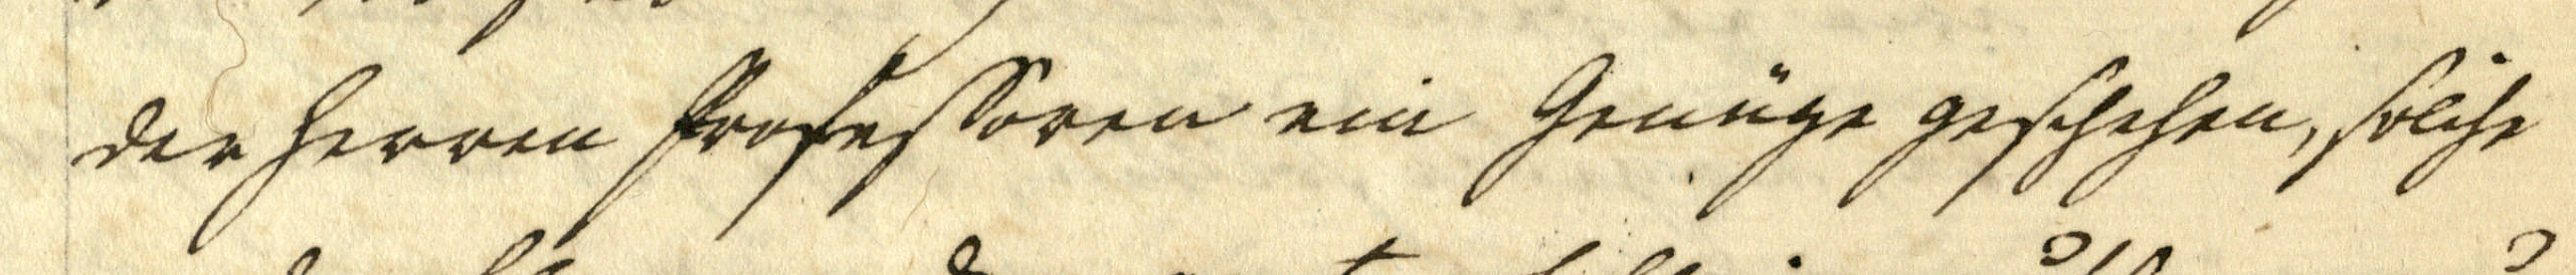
der Herren Professoren ein Genüge geschehen, solche
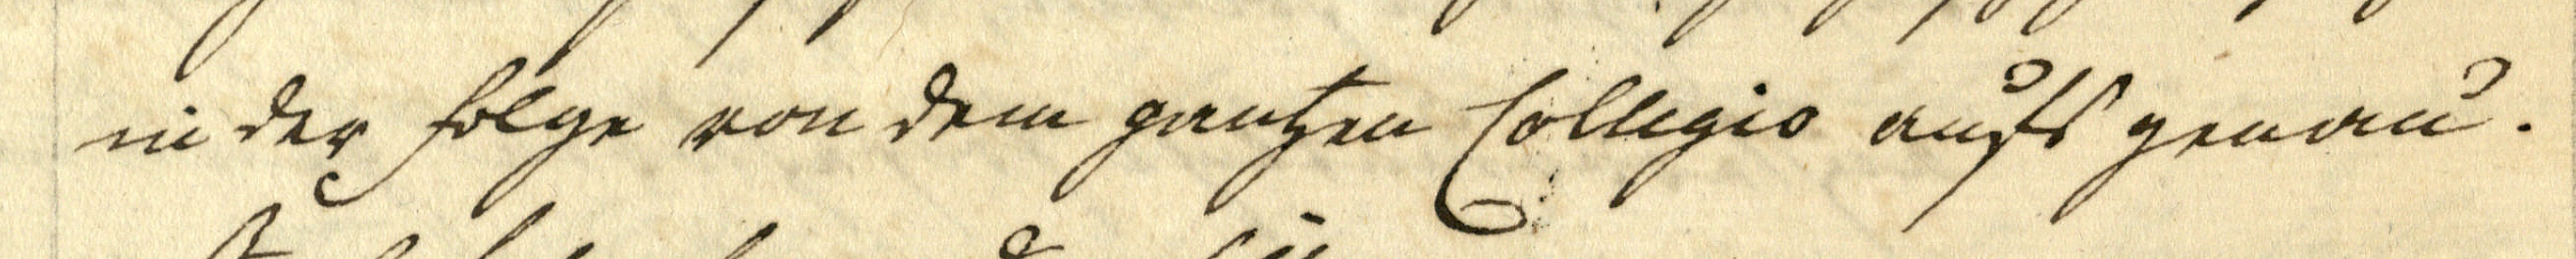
in der Folge von dem gantzen Collegio aufs genau¬
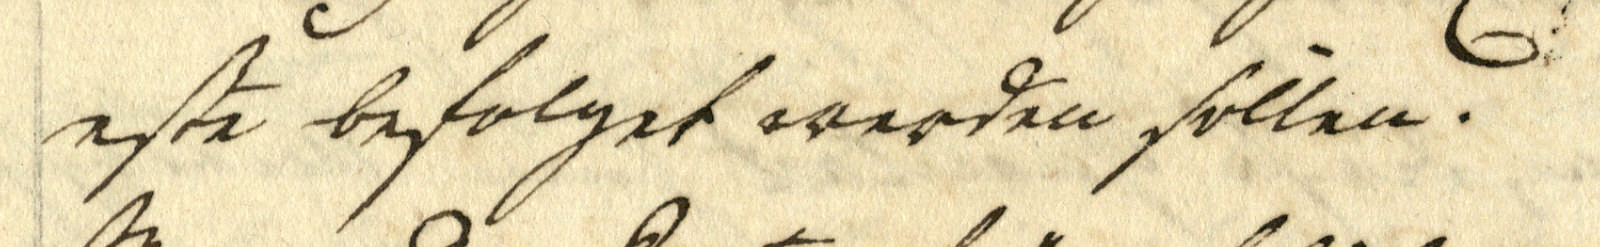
este befolget werden sollen.
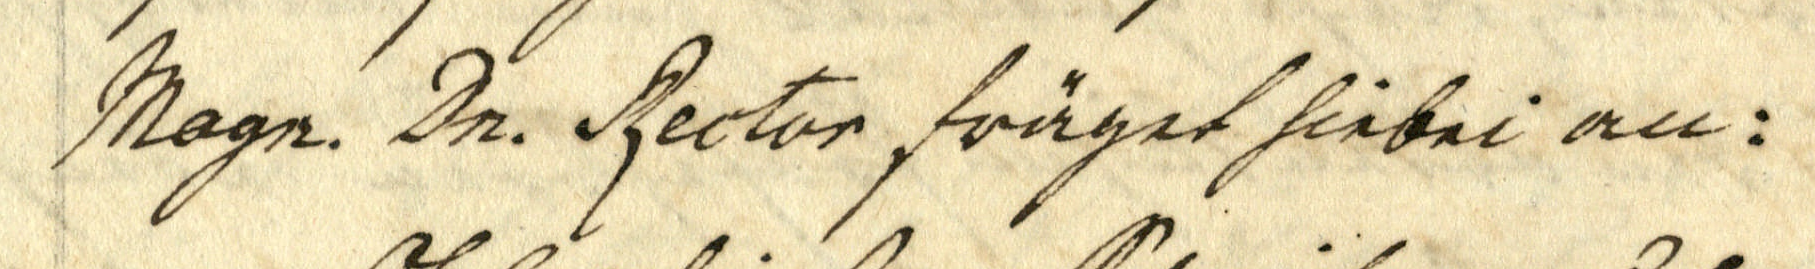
Magn. Dn. Rector fräget hiebei an:
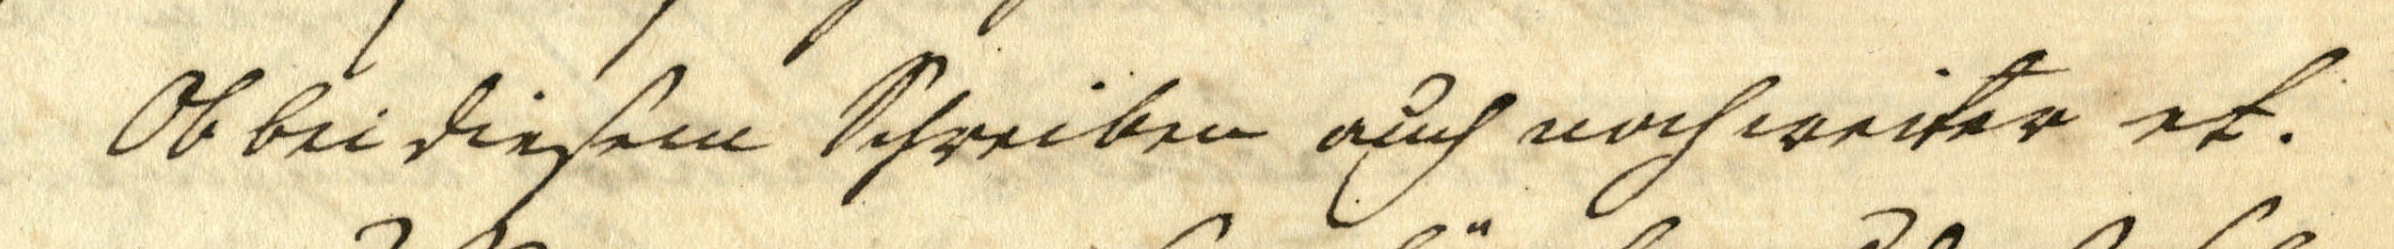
Ob bei diesem Schreiben auch noch weiter et¬
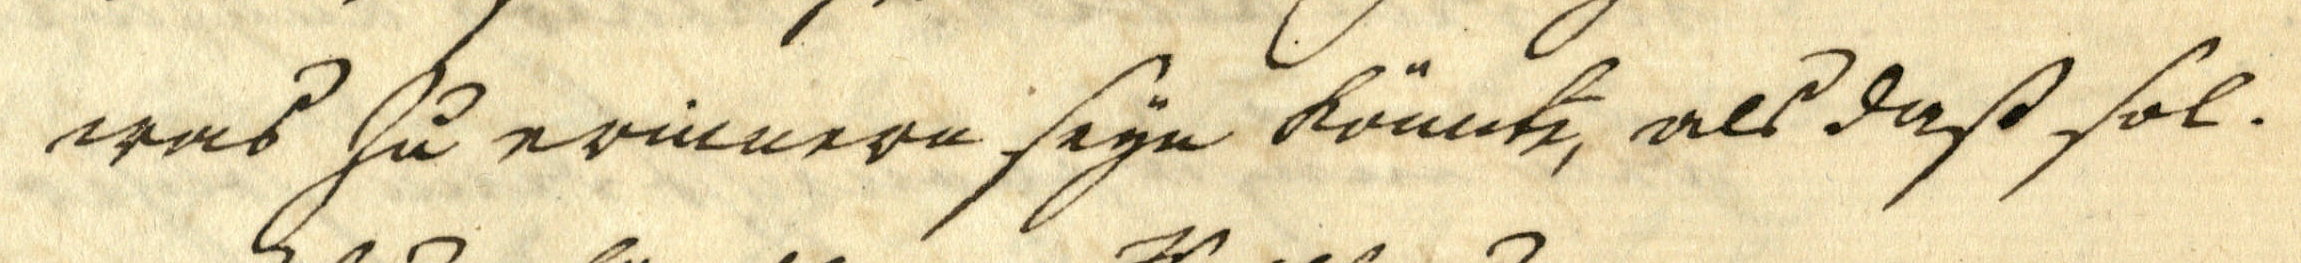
was zu erinnern seÿn könnte, als daß sol¬
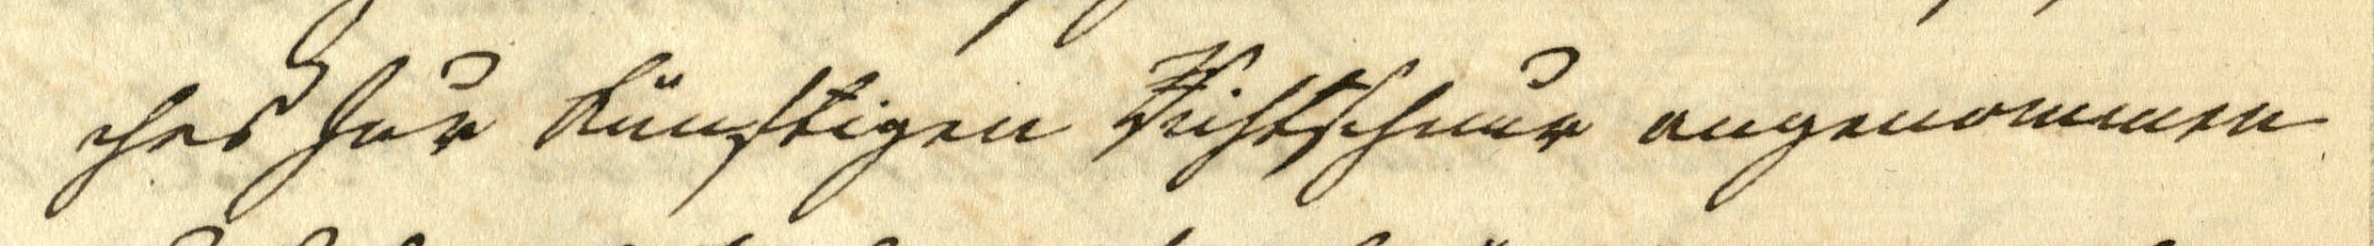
ches zur künftigen Richtschnur angenommen
